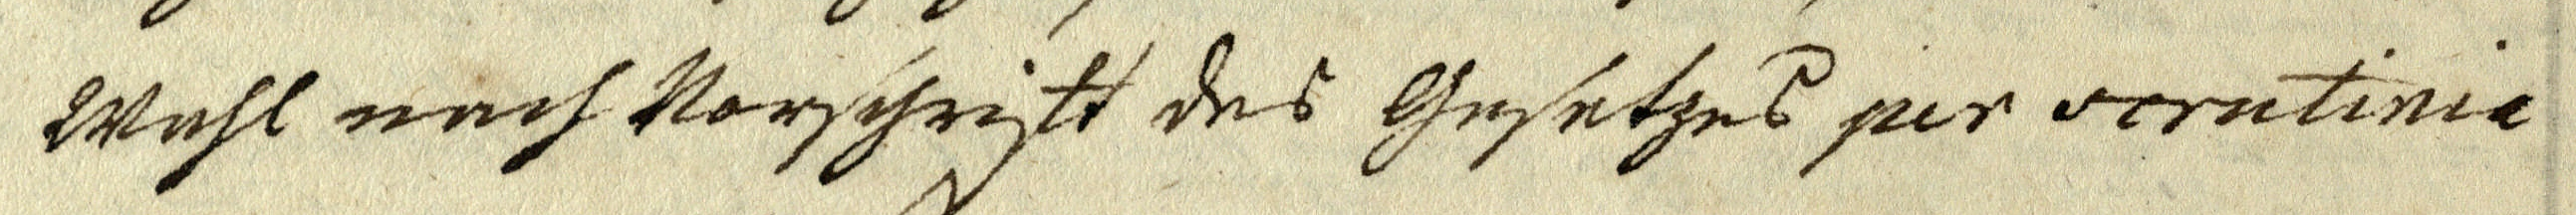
Wahl nach Vorschrift des Gesetzes per scrutinia
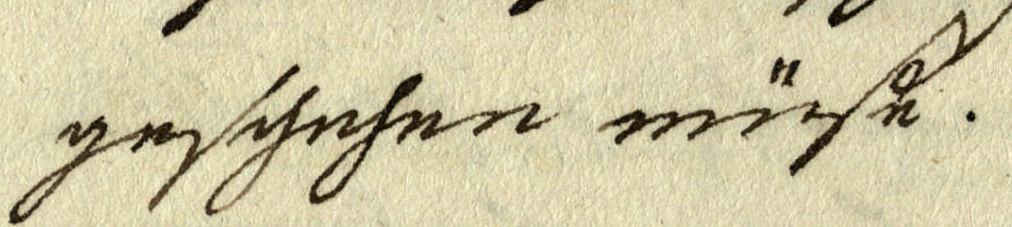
geschehen müße.
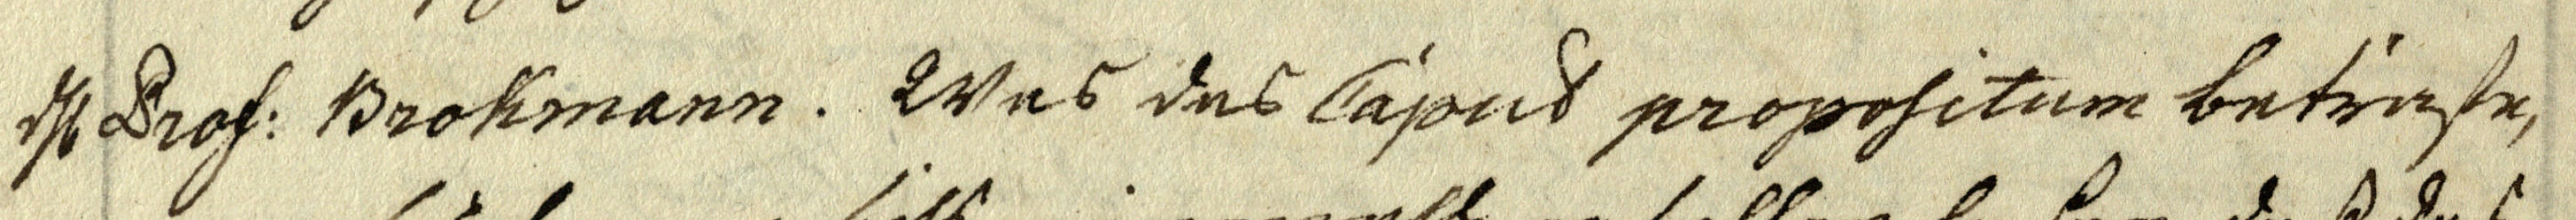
dh. Prof. Brockmann. Was das Caput propositum beträfe,
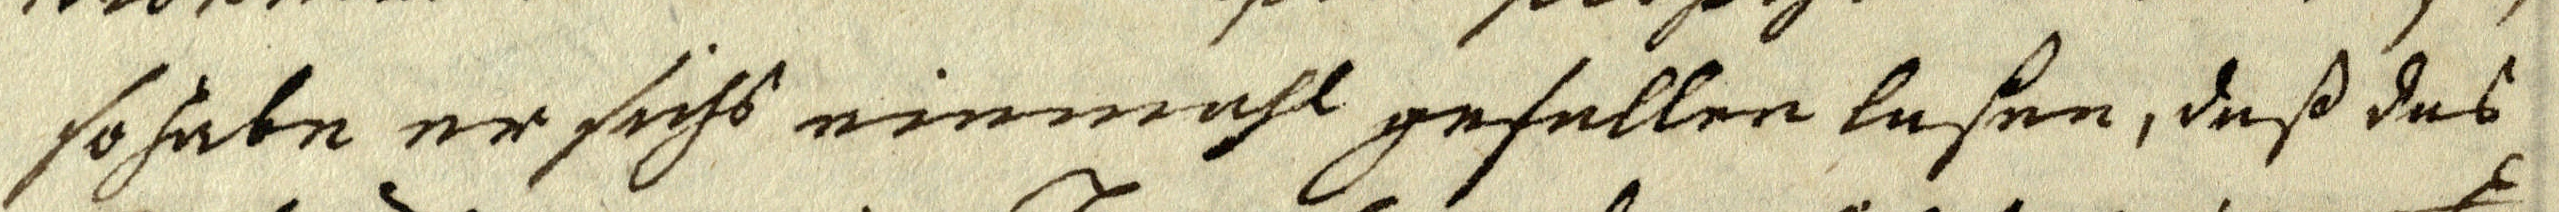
so habe er sichs einmahl gefallen laßen, daß das
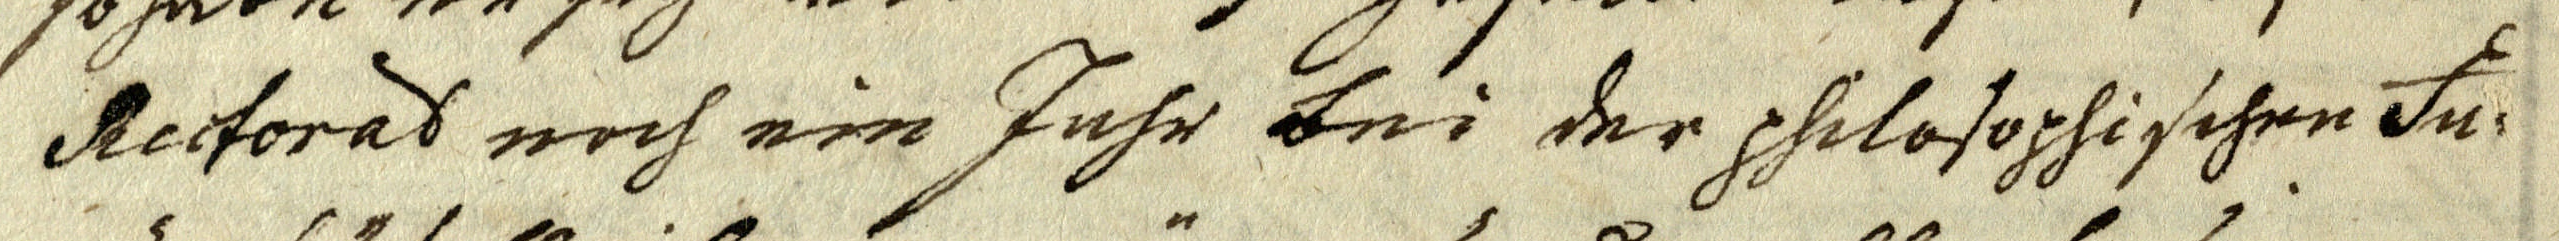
Rectorat noch ein Jahr bei der philosophischen Fa¬
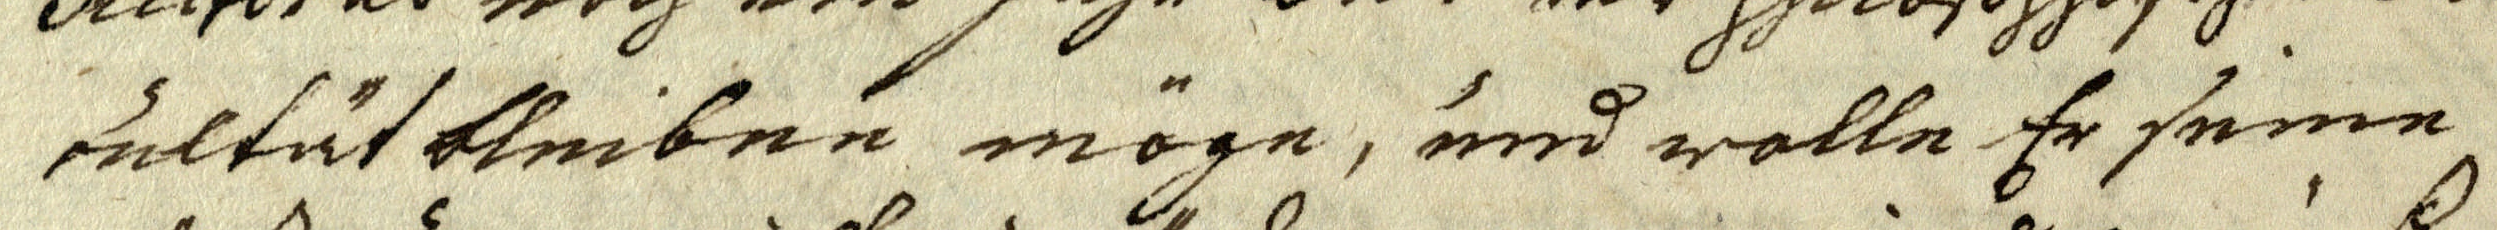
cultät bleiben möge, und wolle Er seine
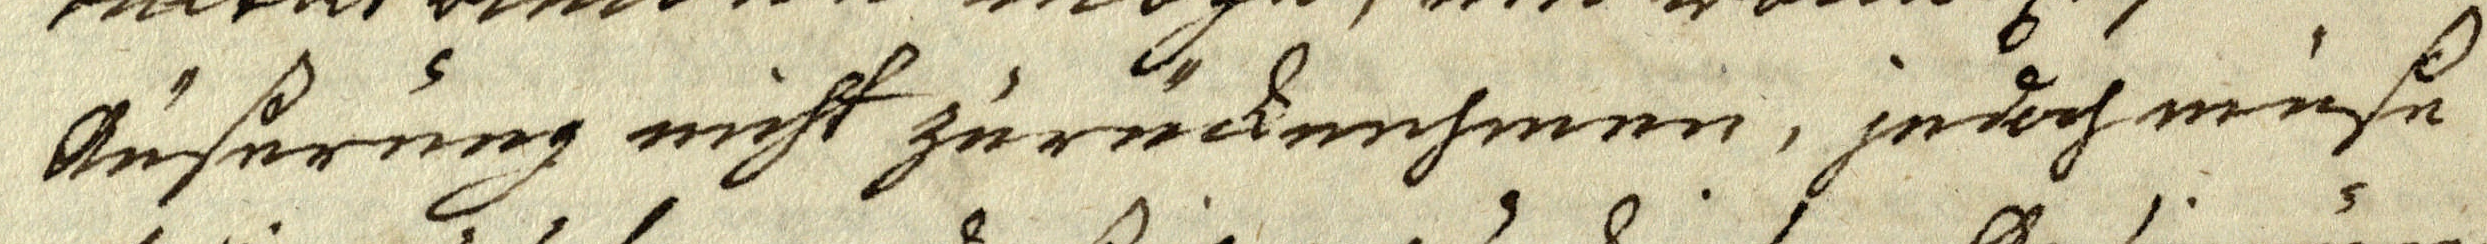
Äußerung nicht zurücknehmen, jedoch müße
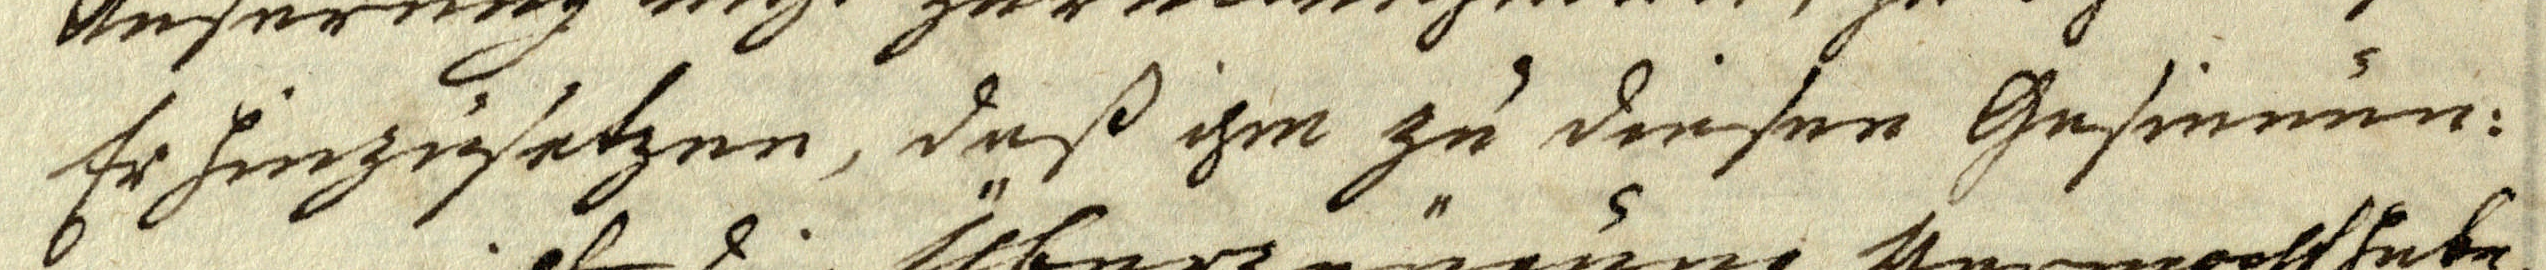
Er hinzusetzen, daß ihm zu diesen Gesinnun¬
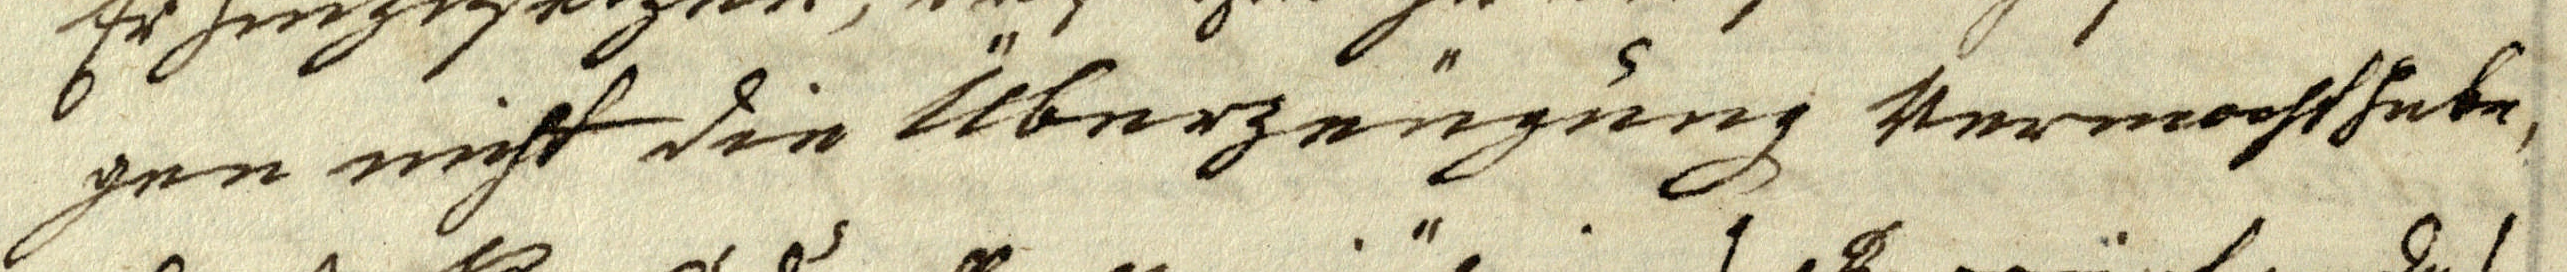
gen nicht die Überzeugung vermocht habe,
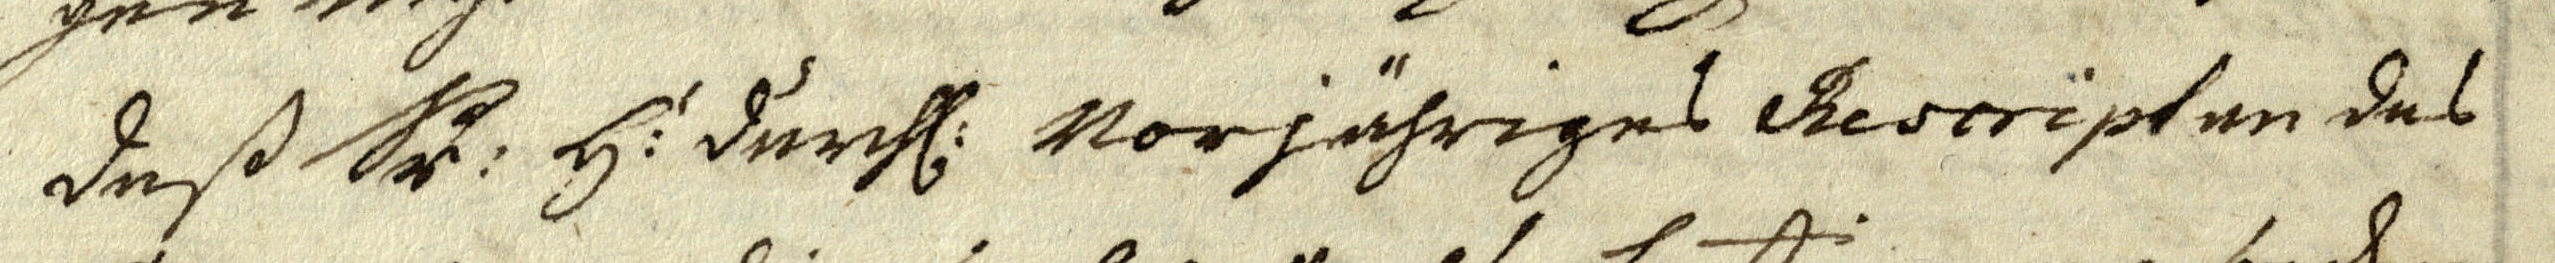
daß Sr H. Durchl. vorjähriges Rescript an das
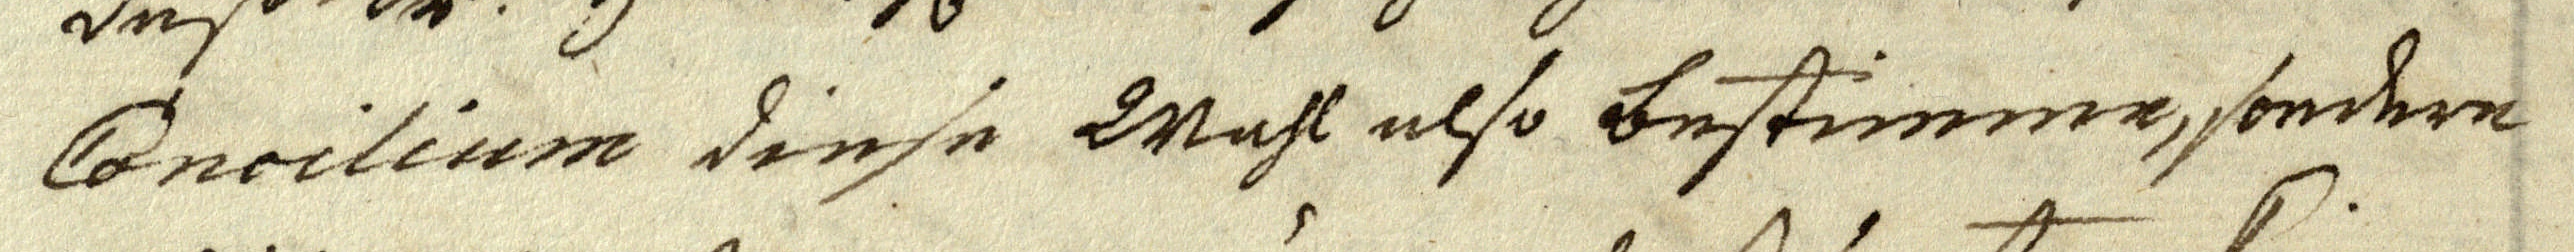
Concilium diese Wahl also bestimme, sondern
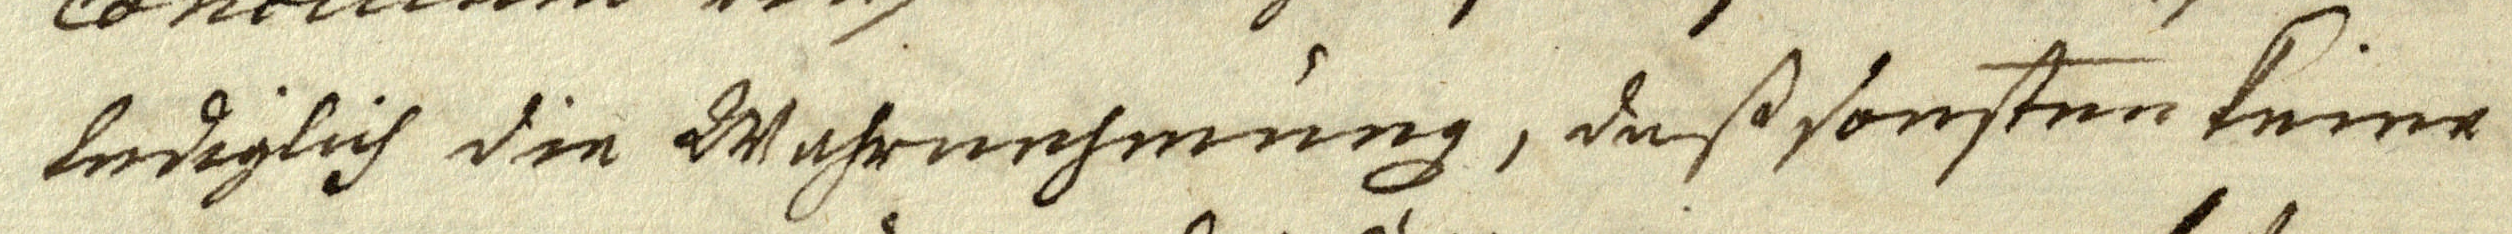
lediglich die Wahrnehmung, daß sonsten keine
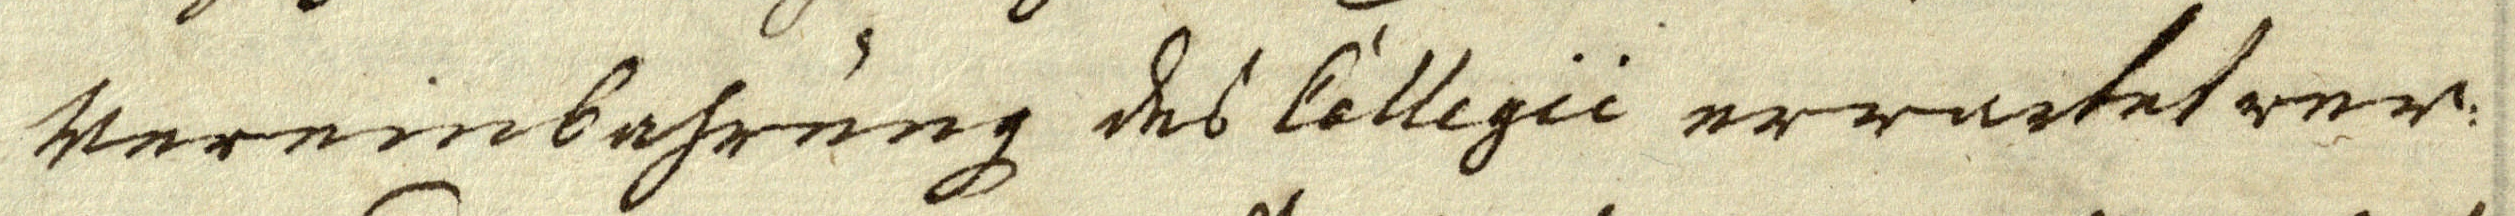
Vereinbahrung des Collegii erwartet wer¬
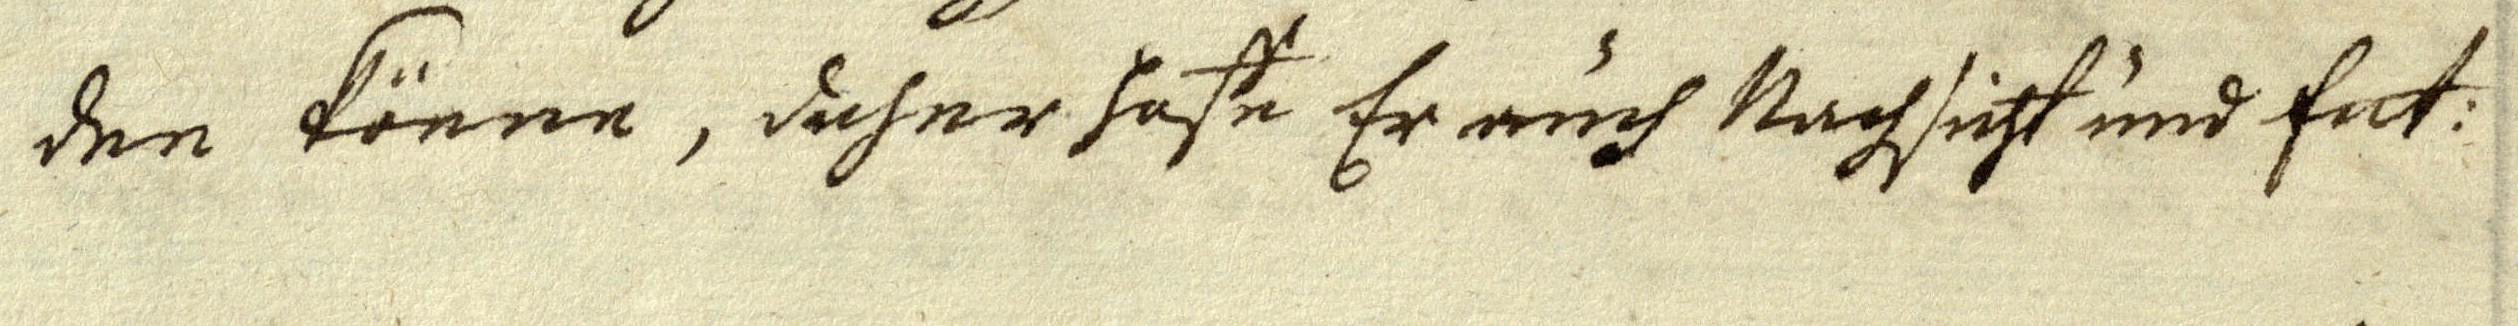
den könne, daher hoffe Er auch Nachsicht und Ent¬
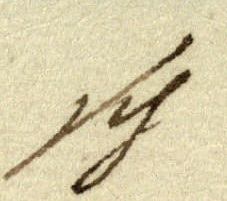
sch
